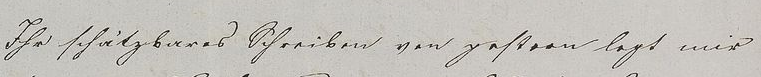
Ihr schätzbares Schreiben von gestern legt mir
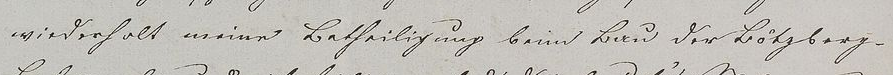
wiederholt meine Betheiligung beim Bau der Bötzberg--
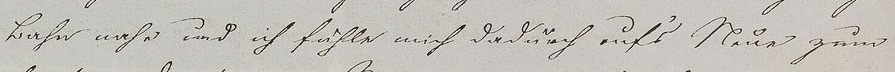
Bahn nahe und ich fühle mich dadurch auf's Neue zum
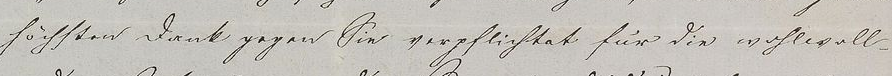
höchsten Dank gegen Sie verpflichtet für die wohlwoll-
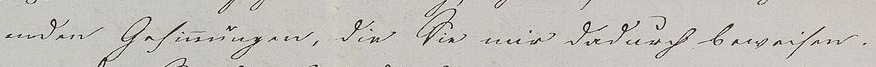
enden Gesinnungen, die Sie mir dadurch beweisen.
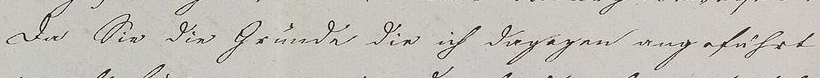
Da Sie die Gründe die ich dagegen angeführt
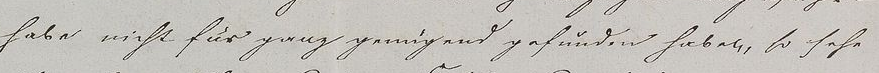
habe nicht für ganz genügend gefunden haben, so sehe
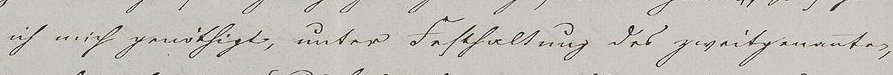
ich mich genöthigt, unter Festhaltung des zweitgenannten,
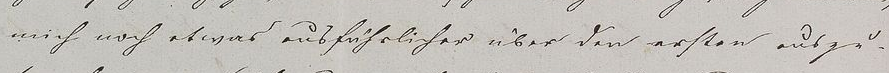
mich noch etwas ausführlicher über den ersten auszu-
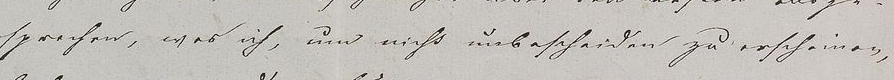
sprechen, was ich, um nicht unbescheiden zu erscheinen,
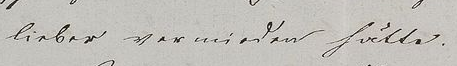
lieber vermieden hätte.
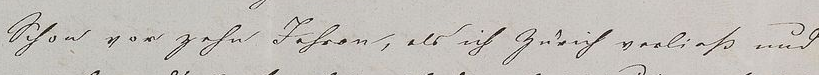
Schon vor zehn Jahren, als ich Zürich verließ und
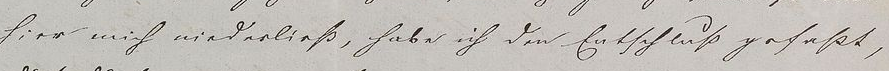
hier mich niederließ, habe ich den Entschluß gefaßt,
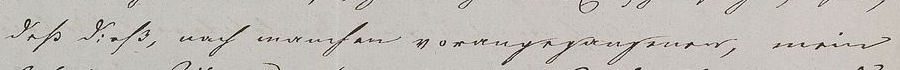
daß dieß, nach manchen vorangegangenen mein
